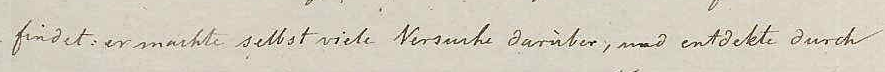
findet: er machte selbst viele Versuche darüber, und entdekte durch
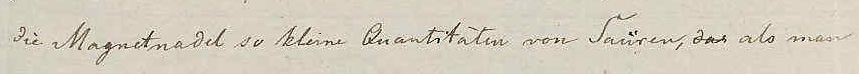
die Magnetnadel so kleine Quantitäten von Säuren, das als man
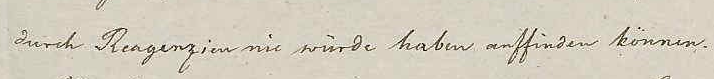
durch Reagenzien nie würde haben auffinden können.
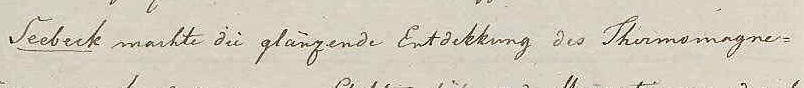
Seebeck machte die glänzende Entdekkung des Thermomagne-
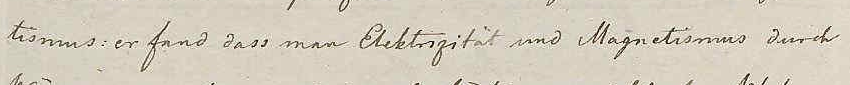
tismus: er fand dass man Elektrizität und Magnetismus durch
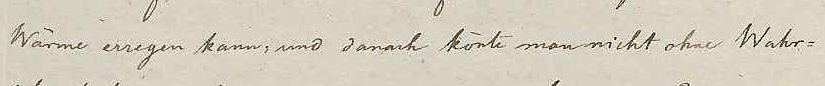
Wärme erregen kann; und danach könte man nicht ohne Wahr-
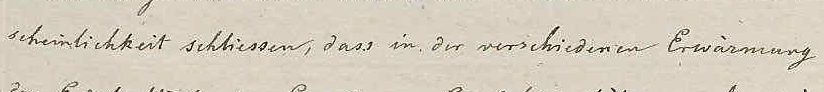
scheinlichkeit schliessen, dass in der verschiedenen Erwärmung
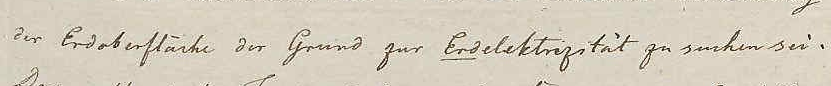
der Erdoberfläche der Grund zur Erdelektrizität zu suchen sei.
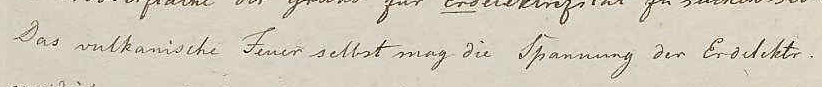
Das vulkanische Feuer selbst mag die Spannung der Erdelektr.
